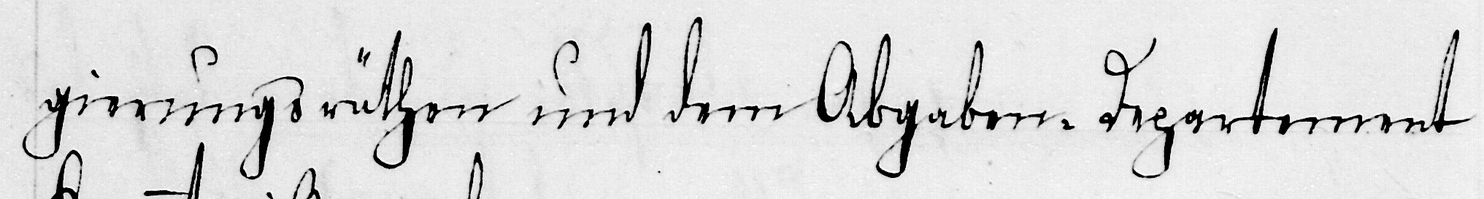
gierungsräthen und dem Abgaben-Departement
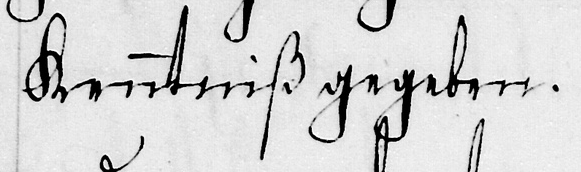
Kenntniß gegeben.
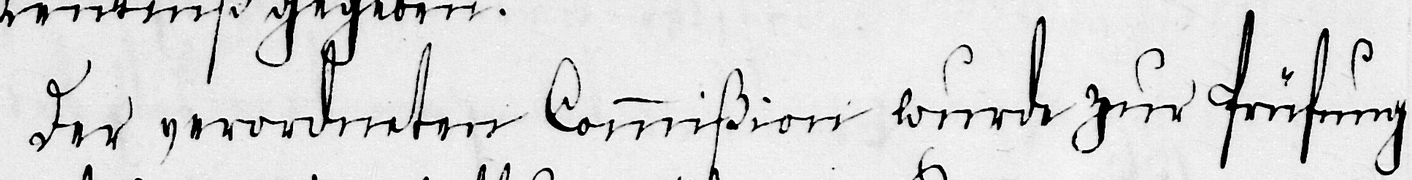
Der verordneten Commißion wurde zur Prüfung
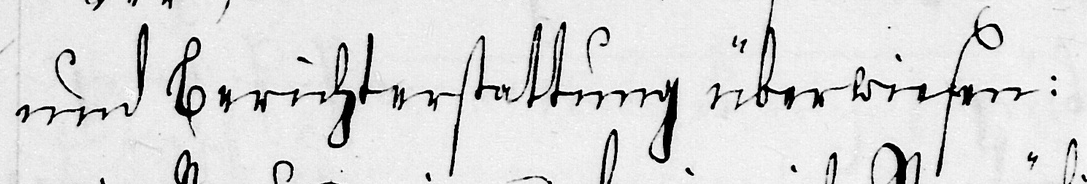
und Berichterstattung überwiesen:
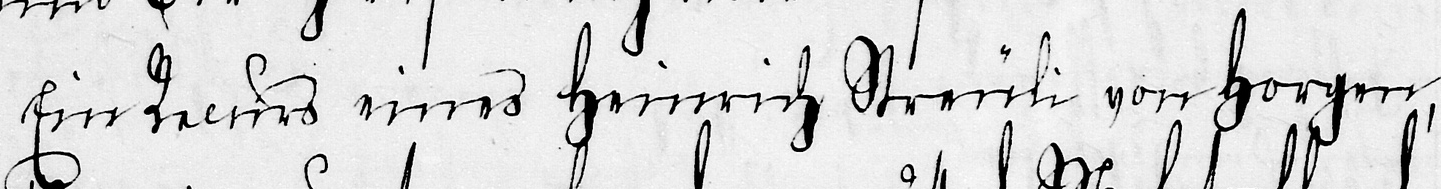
Ein Recurs eines Heinrich Sträuli von Horgen,
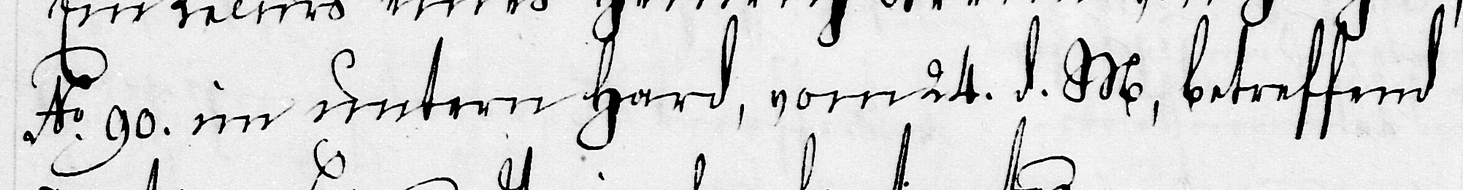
No. 90. im untern Hard, vom 24. d. M, betreffend
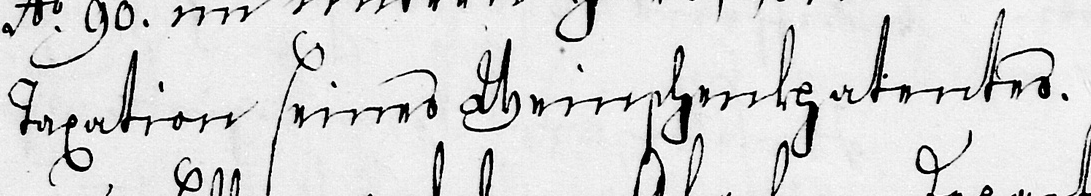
Taxation seines Weinschenkpatentes.
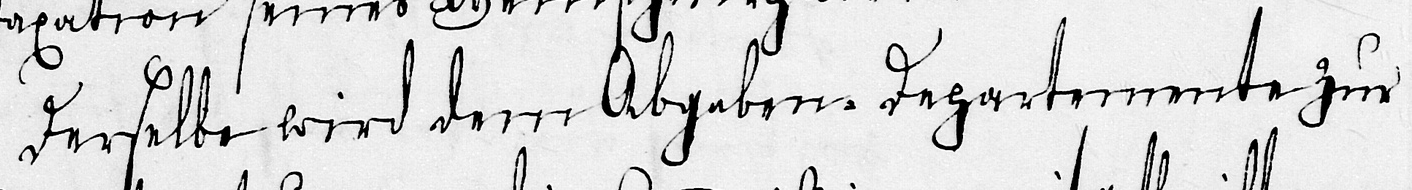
Derselbe wird dem Abgaben-Departemente zur
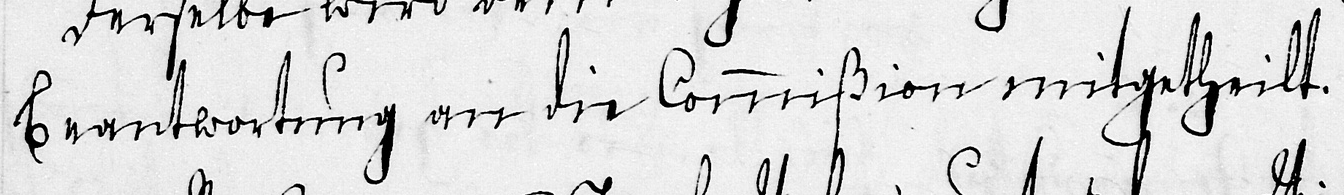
Beantwortung an die Commißion mitgetheilt.
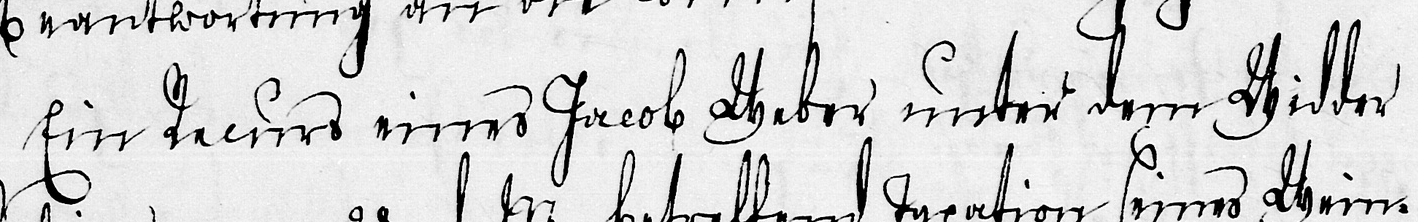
Ein Recurs eines Jacob Weber unter dem Widder
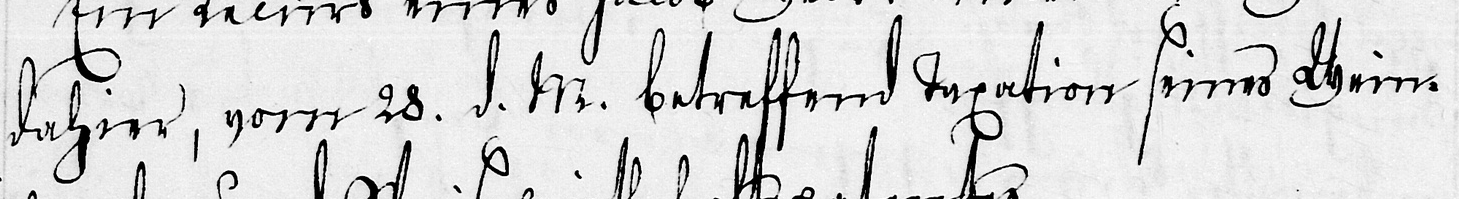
dahier, vom 28. d. M. betreffend Taxation seines Weins¬
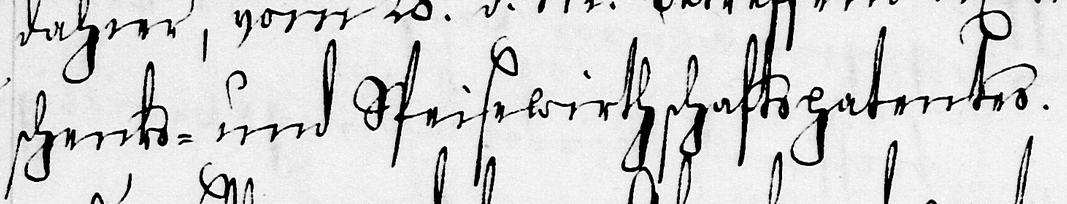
chenks- und Speisewirthschaftspatentes.
